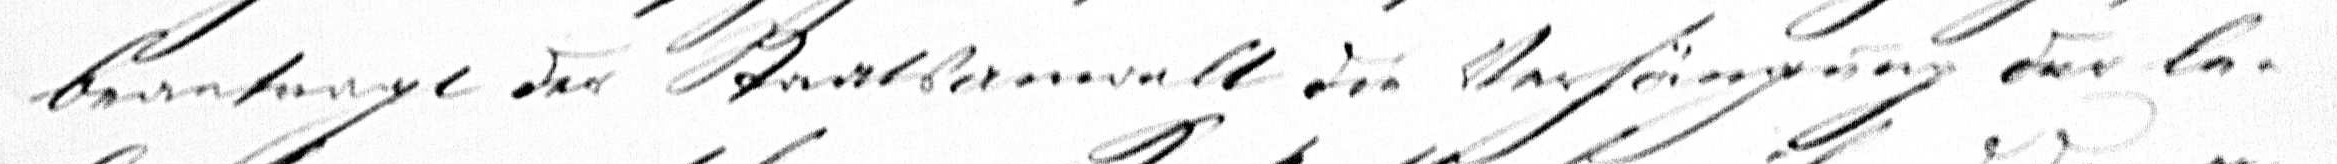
beantragt der Staatsanwalt die Verhängung der le¬
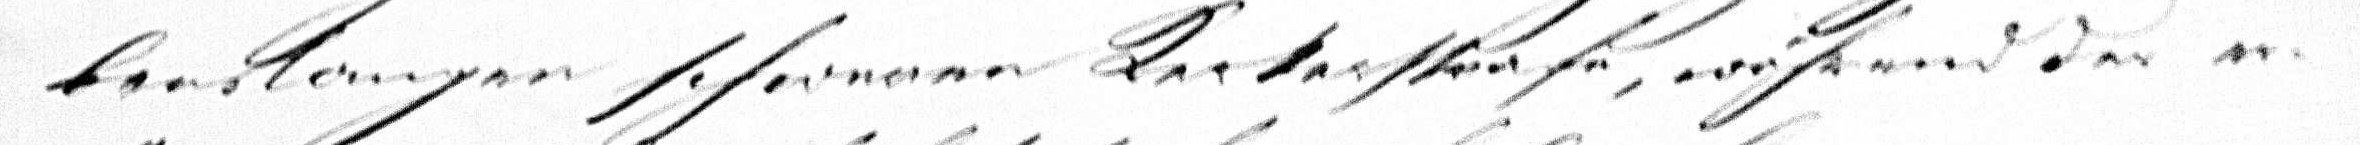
benslangen schweren Kerkerstrafe, während der er¬
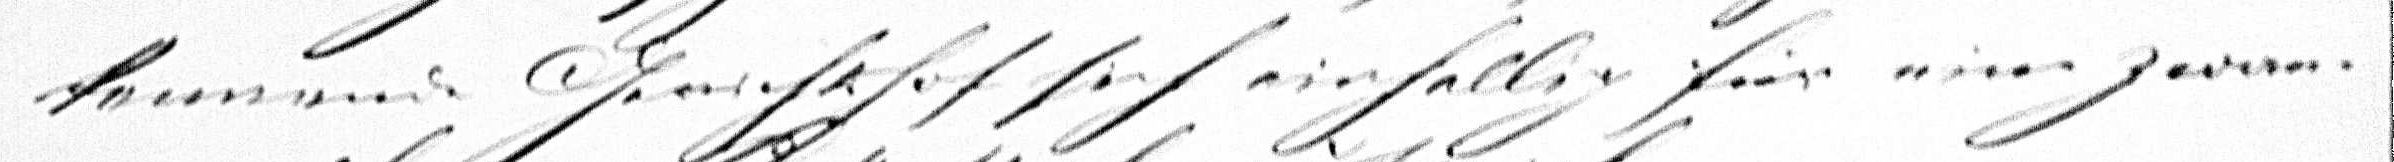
kennende Gerichtshof sich einhellig für eine zwan¬
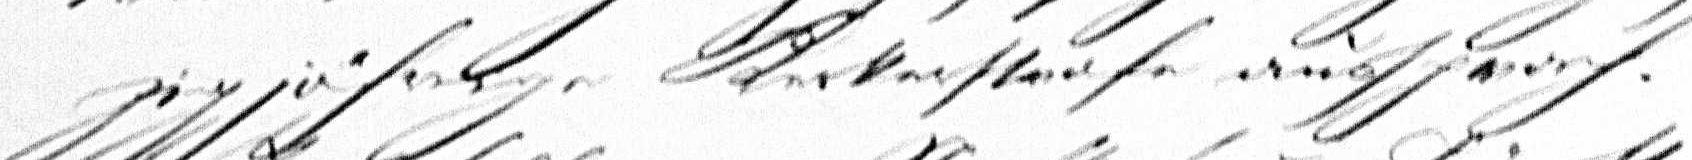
zigjährige Kerkerstrafe aussprach.
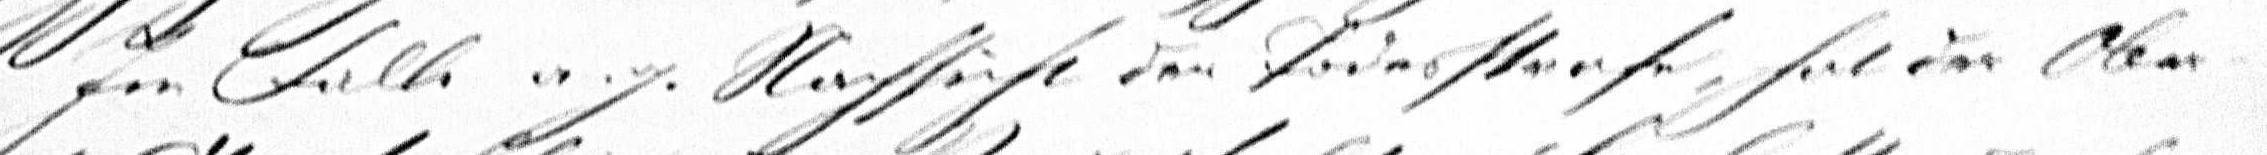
Im Falle a.g. Nachsicht der Todesstrafe, hat der Ober¬
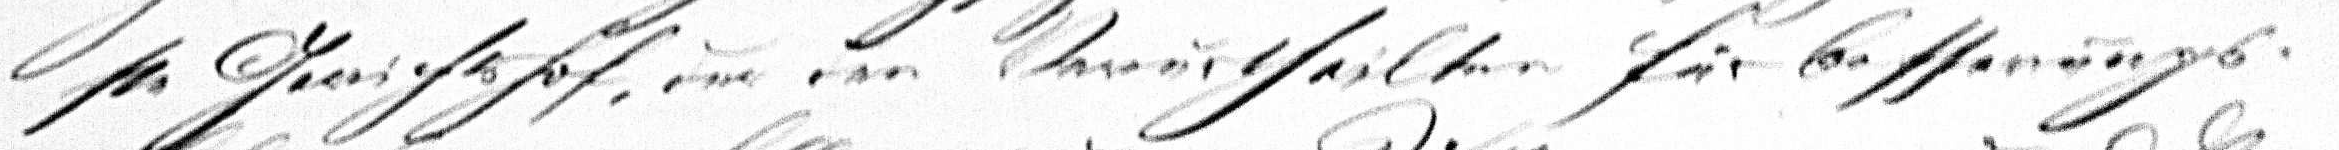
ste Gerichtshof, der den Verurtheilten für besserungs¬
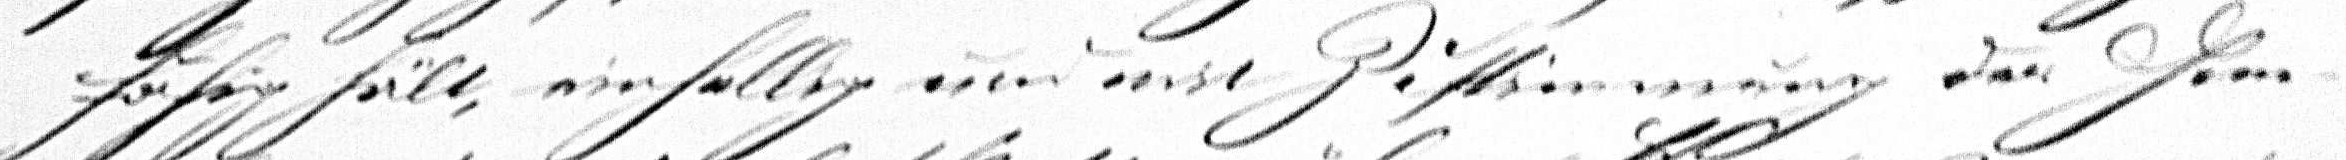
fähig hält, einhellig und mit Zustimmung der Gene¬
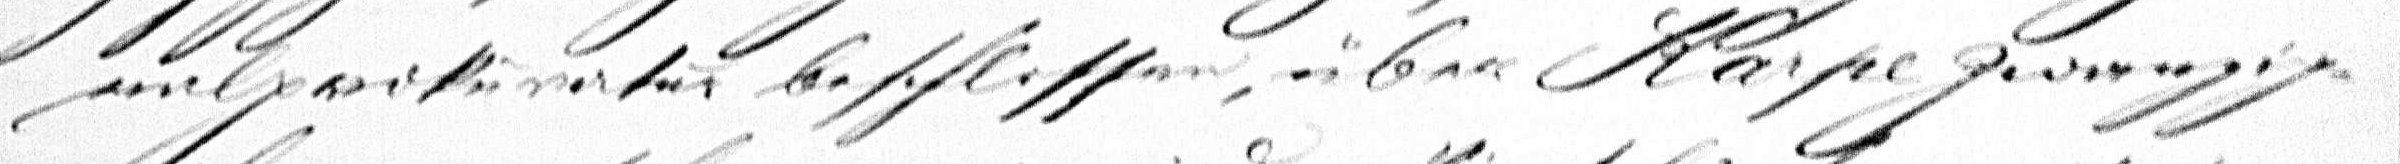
ralprokuratur beschlossen, über Karpe zwanzig¬
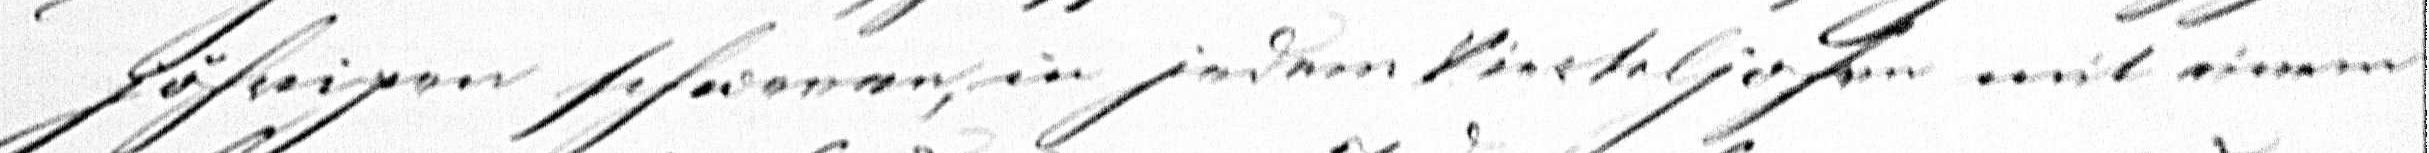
jährigen schweren, in jedem Vierteljahre mit einem
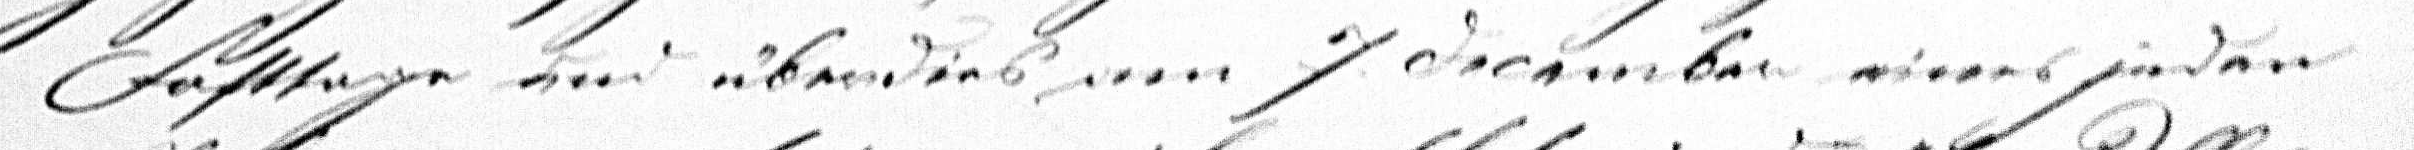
Fasttage und überdies am 7.December eines jeden
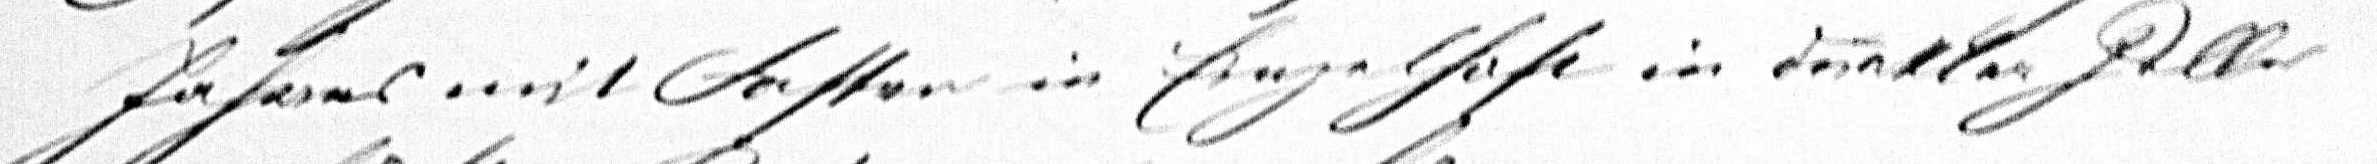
Jahres mit Fasten in Einzelhaft in dunkler Zelle
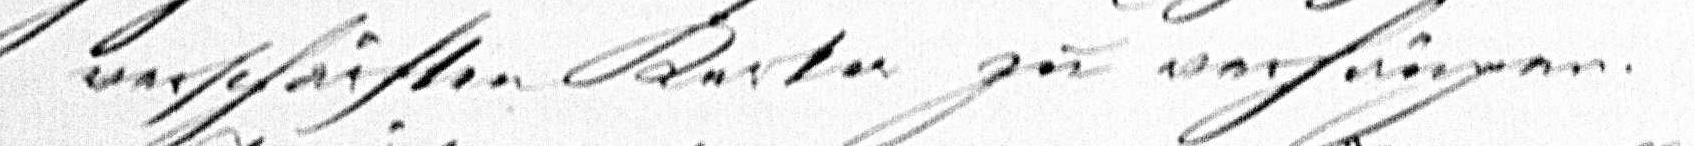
verschärften Kerker zu verhängen.
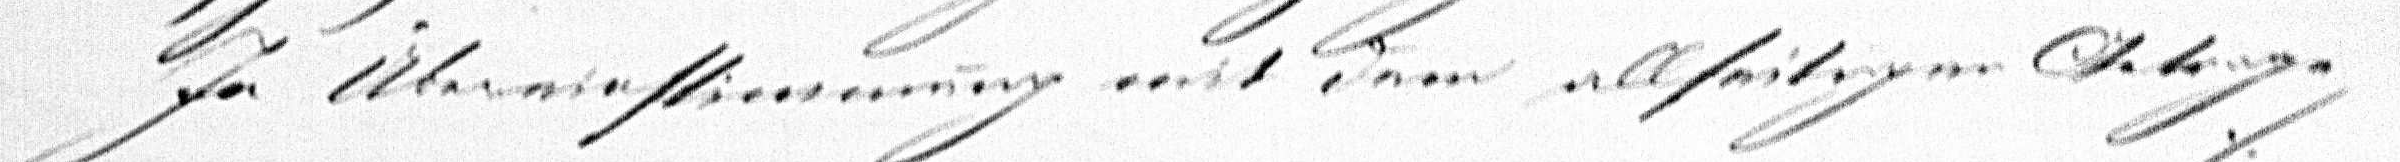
In Übereinstimmung mit dem allseitigen Antrage
